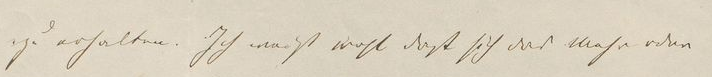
zu erhalten. Ich weiß wohl daß sich das Mehr oder
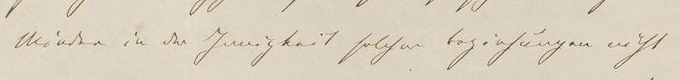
Minder in der Innigkeit solcher Beziehungen nicht
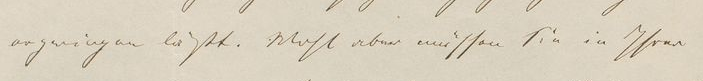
erzwingen läßt. Wohl aber müssen Sie in Ihrer
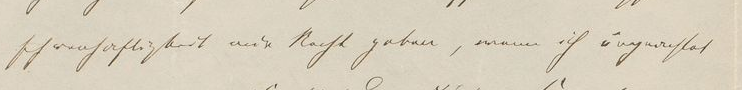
Ehrenhaftigkeit mir Recht geben, wenn ich ungeachtet
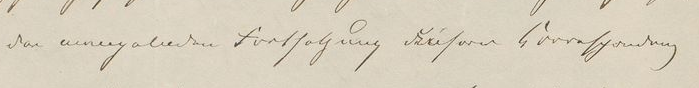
der mangelnden Fortsetzung unserer Correspondenz
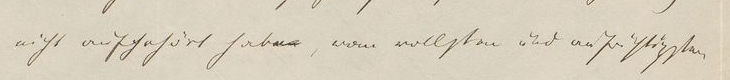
nicht aufgehört haben, vom vollsten und aufrichtigsten
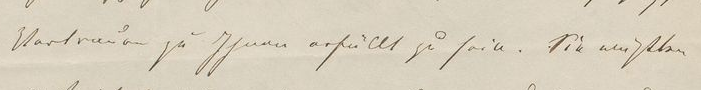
Vertrauen zu Ihnen erfüllt zu sein. Sie wußten
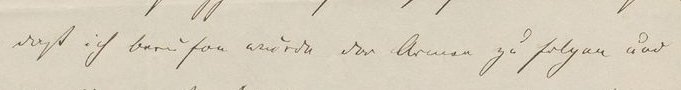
daß ich berufen wurde der Armee zu folgen und
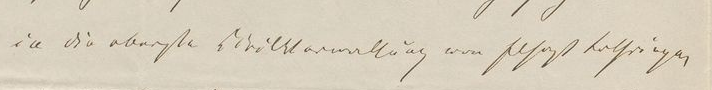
in die oberste Civilverwaltung von Elsaß Lothringen
